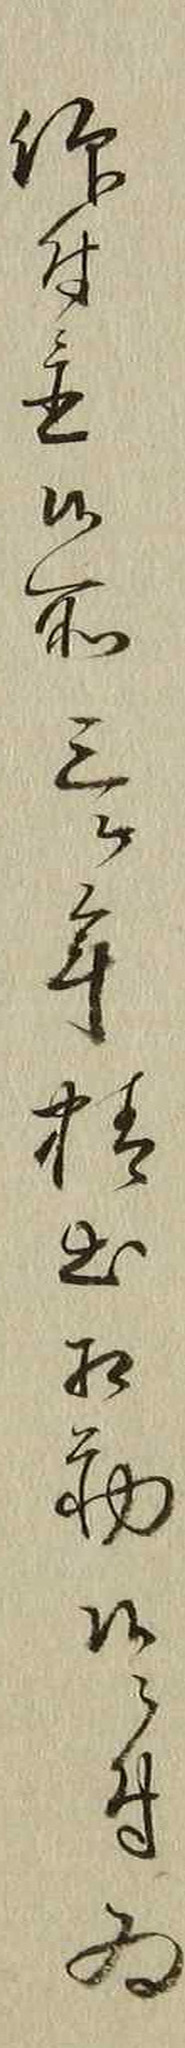仰付置候所三ヶ年精出相勤候ニ付為
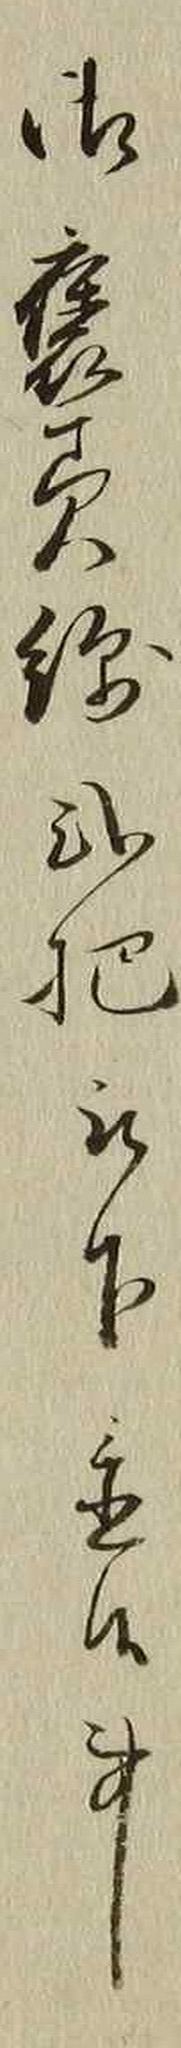御褒美綿弐把被下置候事
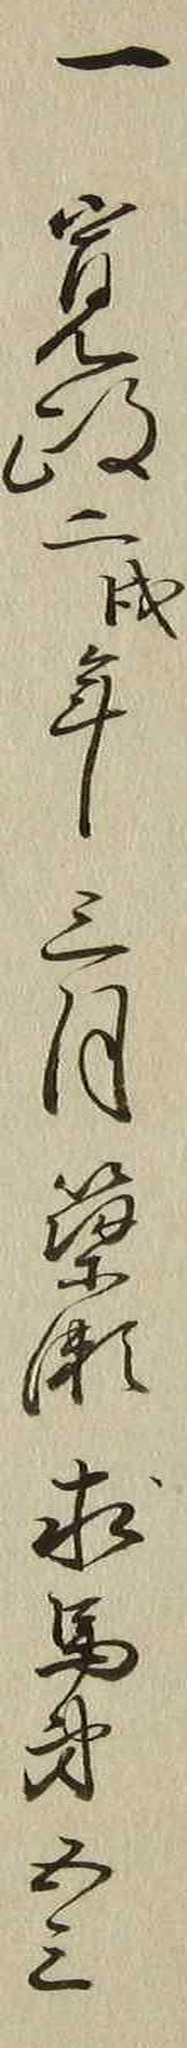一寛政二戌年三月簗瀬求馬弟五三
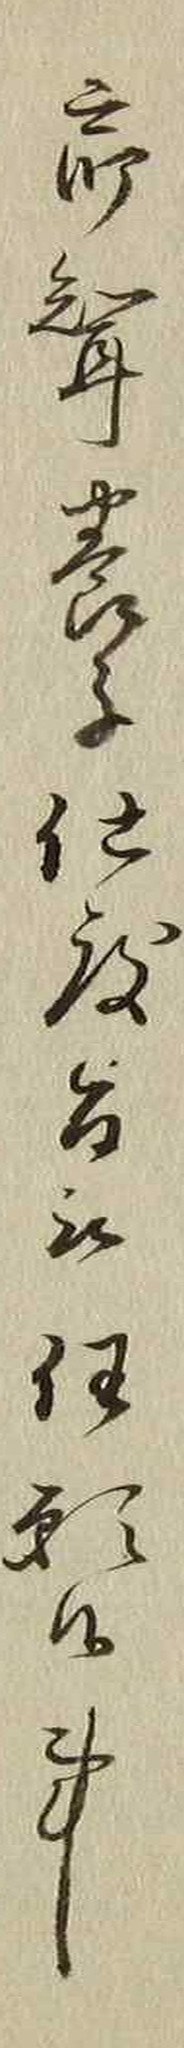郎婿養子仕度旨被任願候事
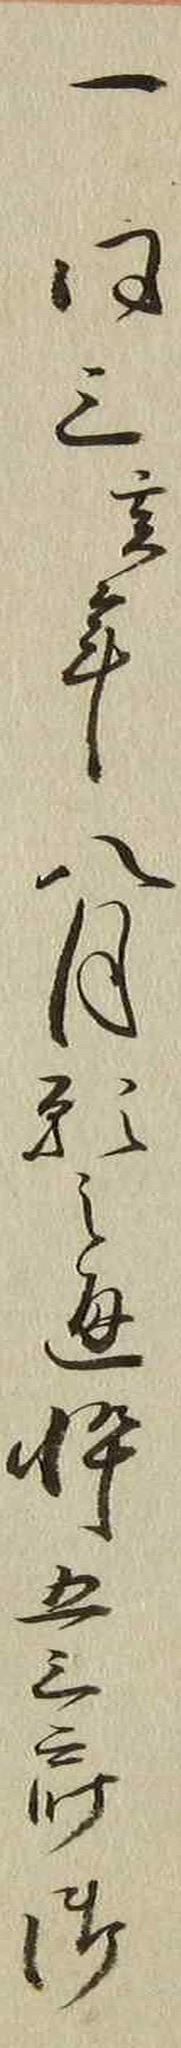一同三亥年八月願之通忰五三郎御
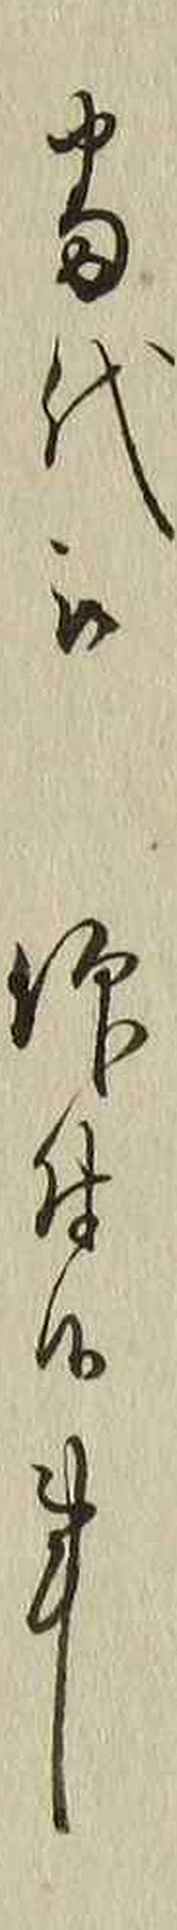番代被仰付候事
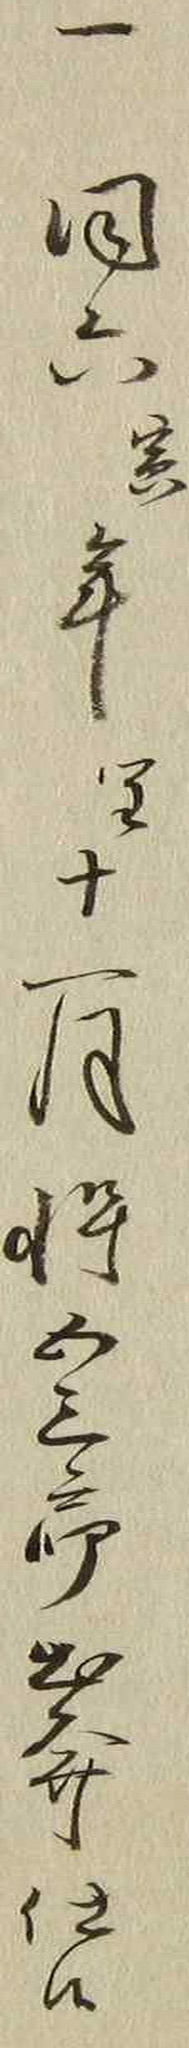一同六寅年閏十一月忰五三郎出奔仕候
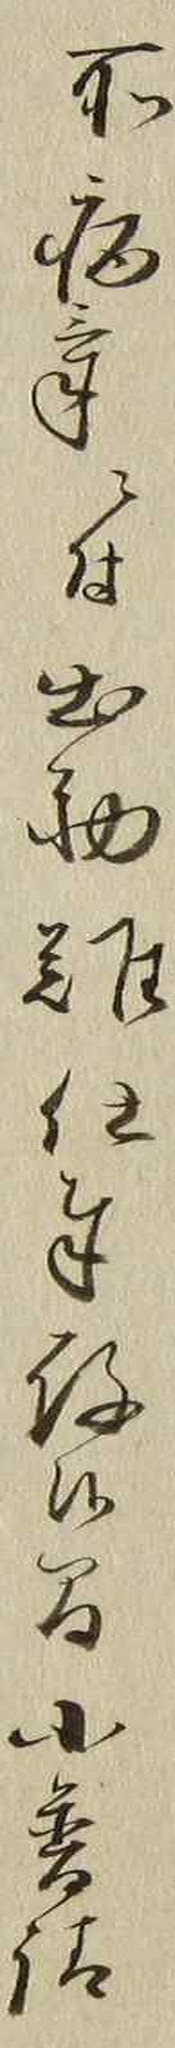所病気ニ付出勤難仕奉存候間小普請
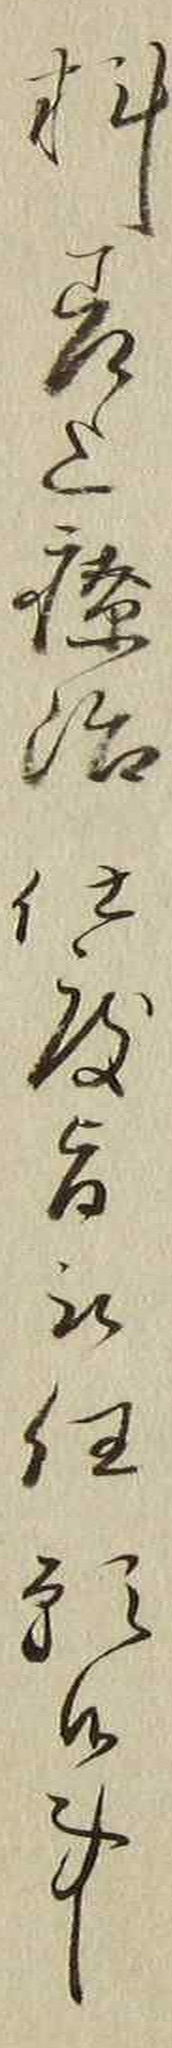料差上療治仕度旨被任願候事
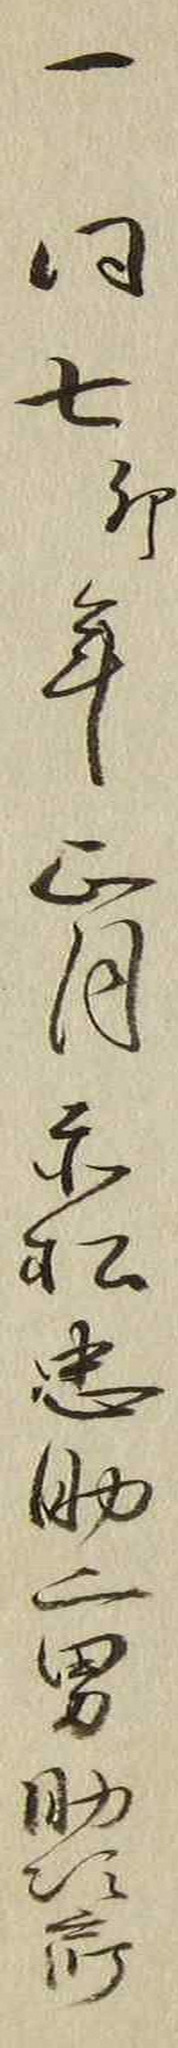一同七卯年正月赤松忠助二男助次郎
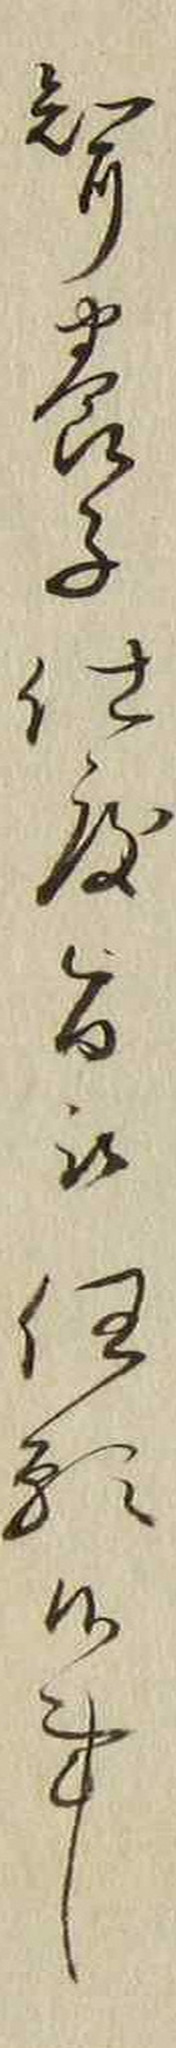郎婿養子仕度旨被任願候事
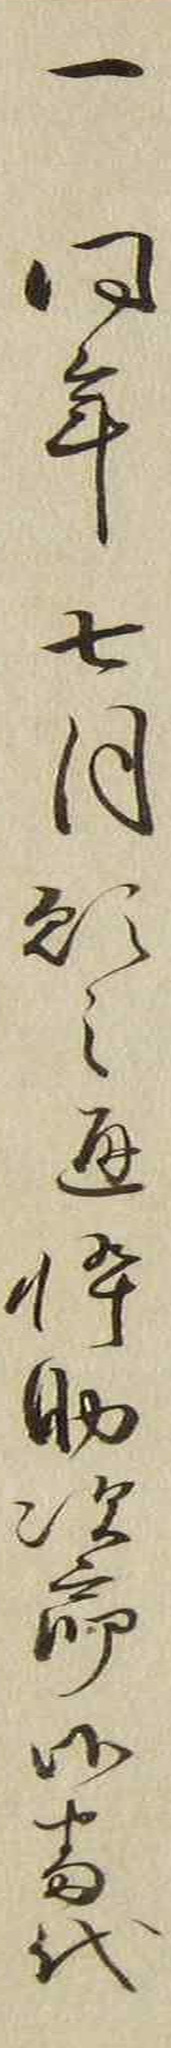一同年七月願之通忰助次郎御番代

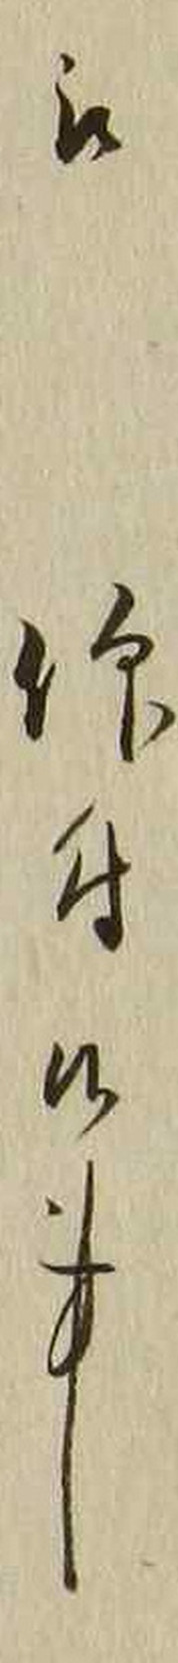被仰付候事
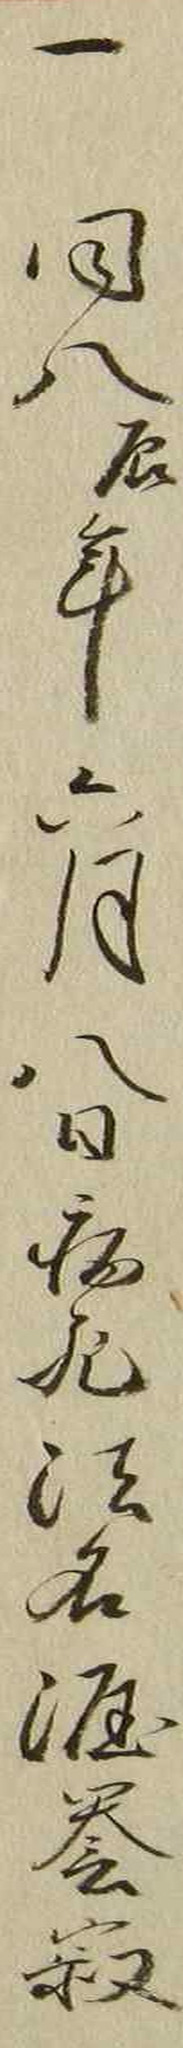一同八辰年六月八日病死法名涯誉寂
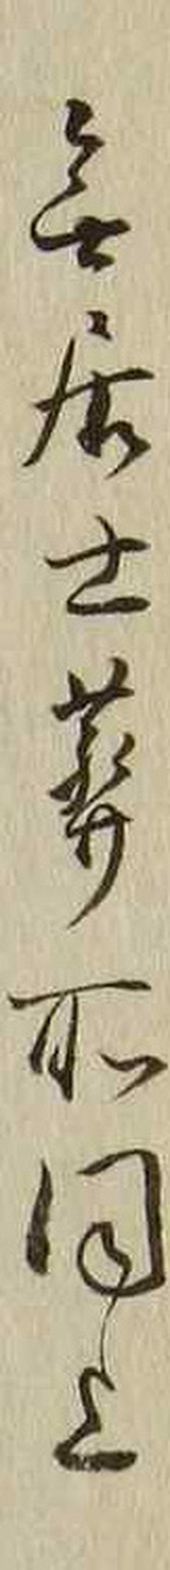無居士葬所同上
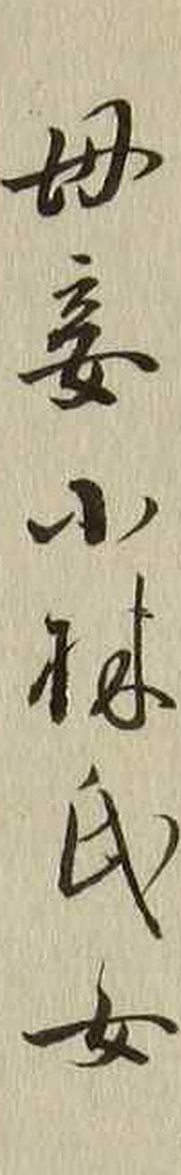母妾小林氏女
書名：諸士系譜　巻之68　を之部2
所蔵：会津若松市立会津図書館
